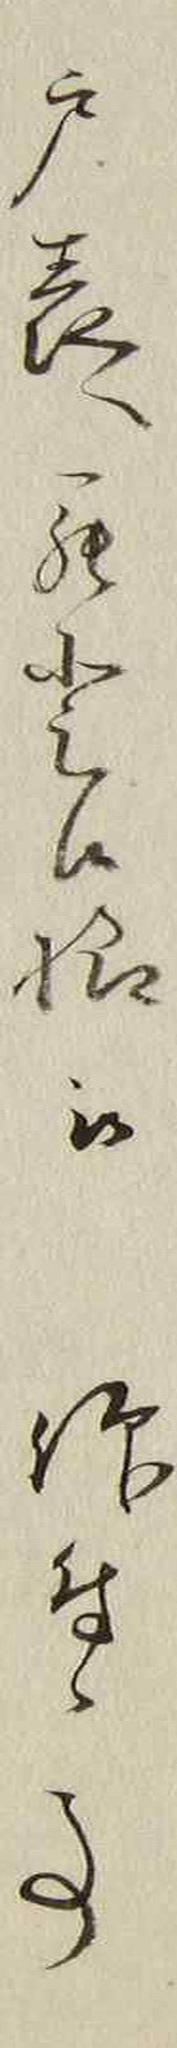戸表へ罷登候様被仰付候事
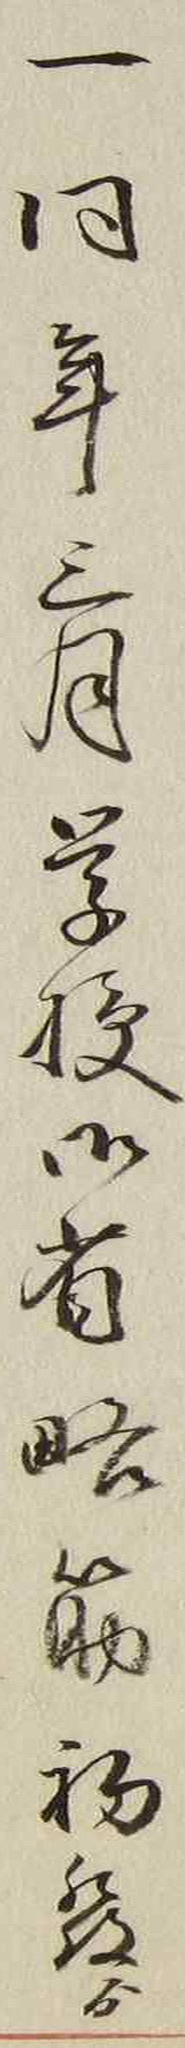一同年三月学校御省略筋初発ゟ
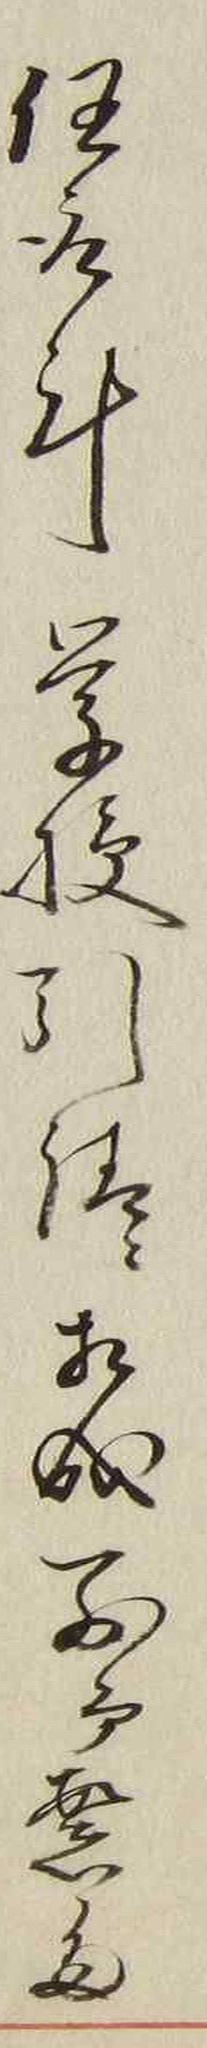任取計学校引請ニ相成別而繁多

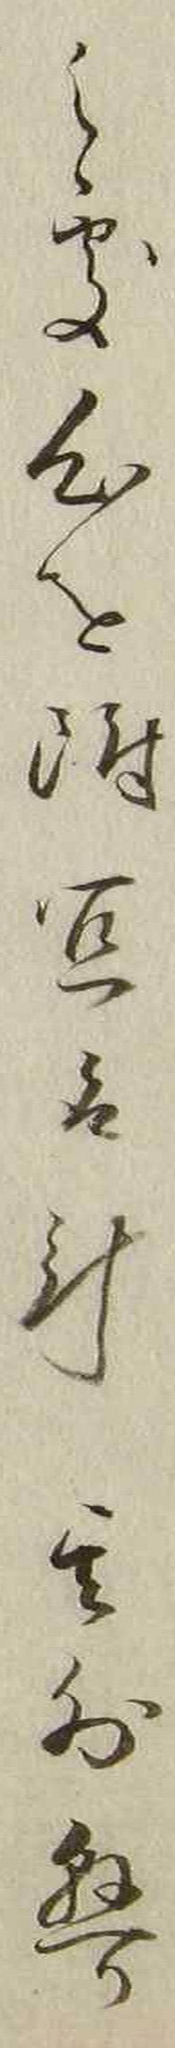之処心を附宜取計其外懸り
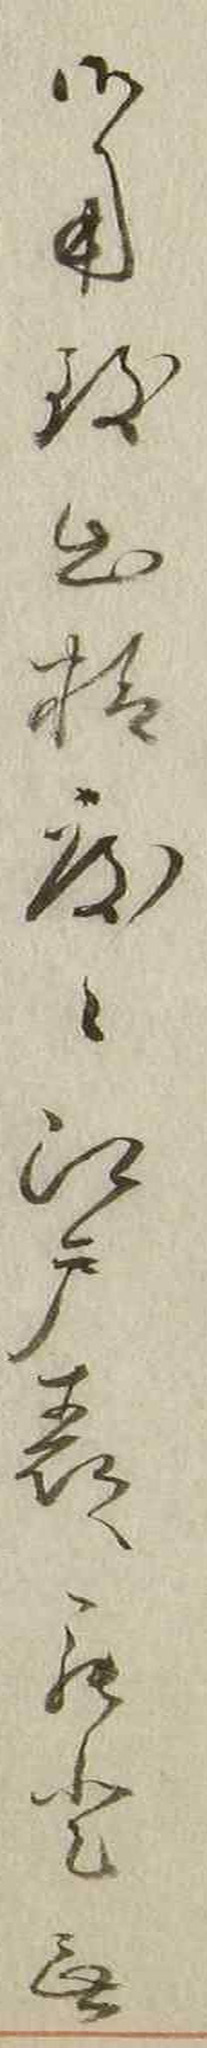御用致出精度々江戸表へ罷登無
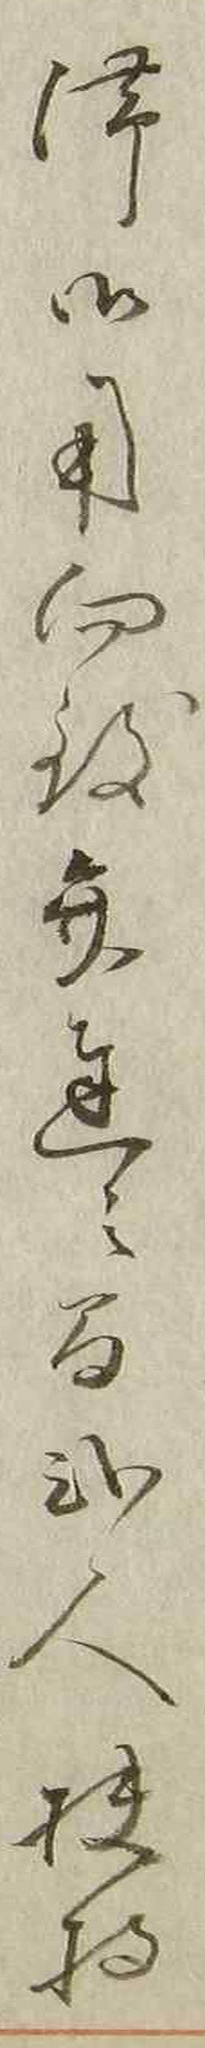滞御用向致弁達候間弐人扶持
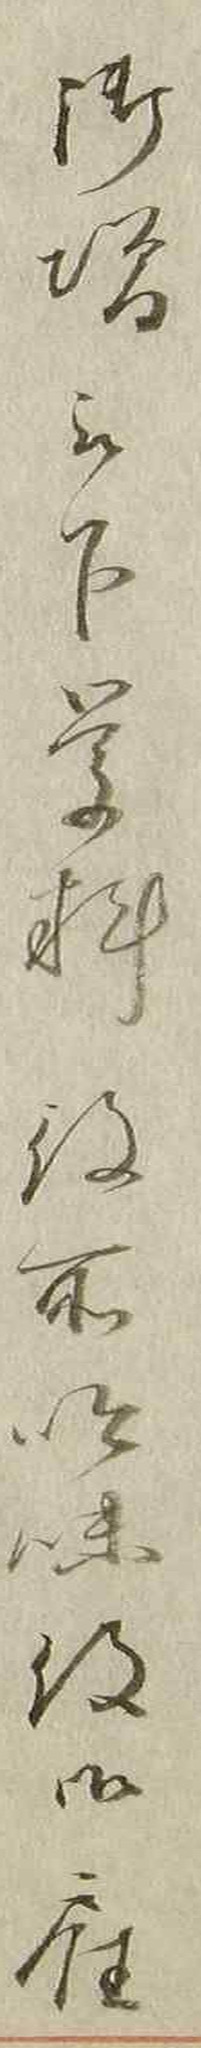御増被下学料役所吟味役御雇
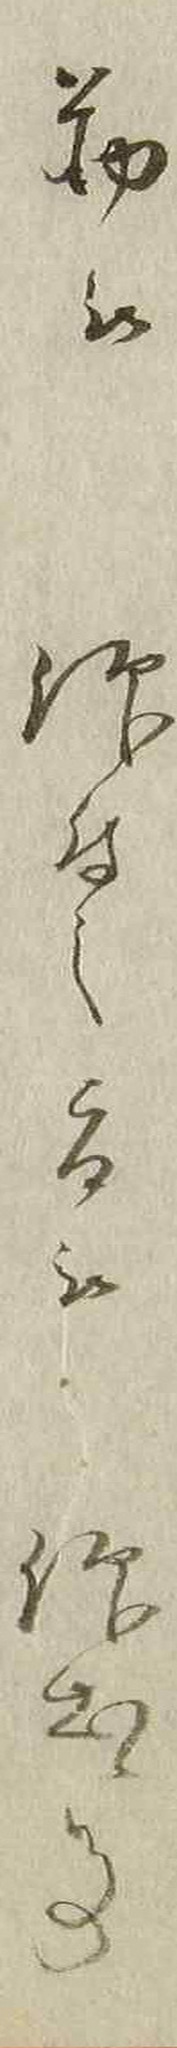勤被仰付之旨被仰出候事
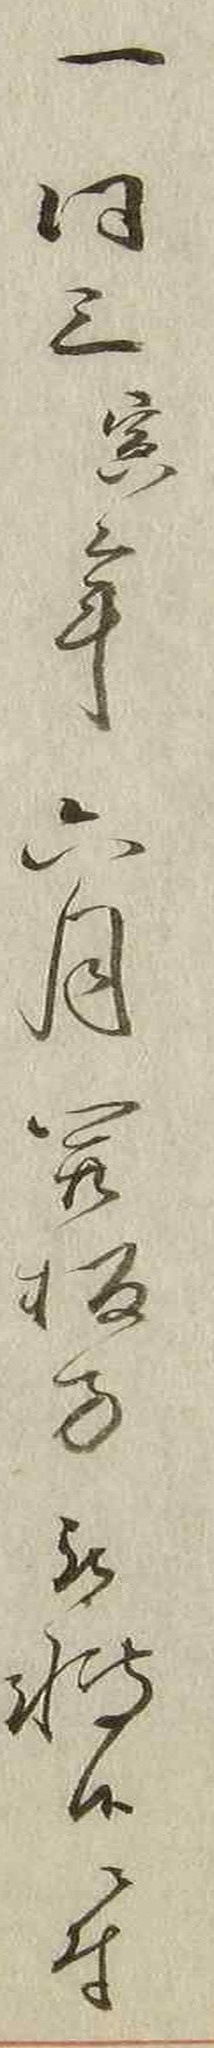一同三寅年六月開板方被転候ニ付
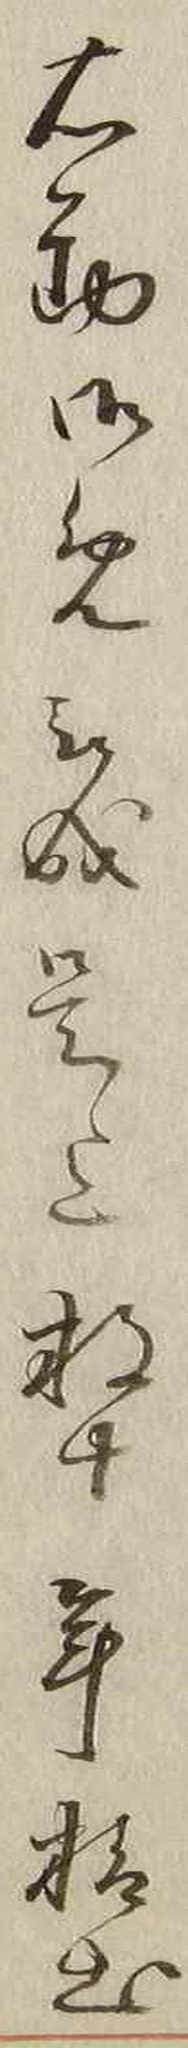右勤御免被成是迄数十年精出
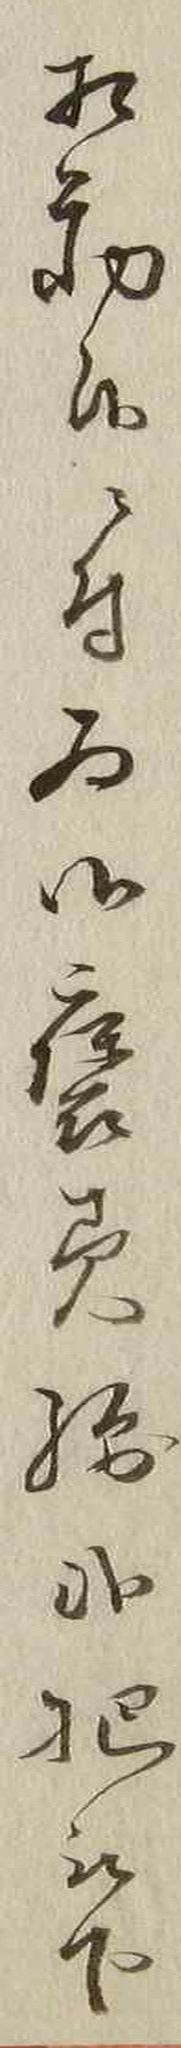相勤候ニ付為御褒美綿弐把被下
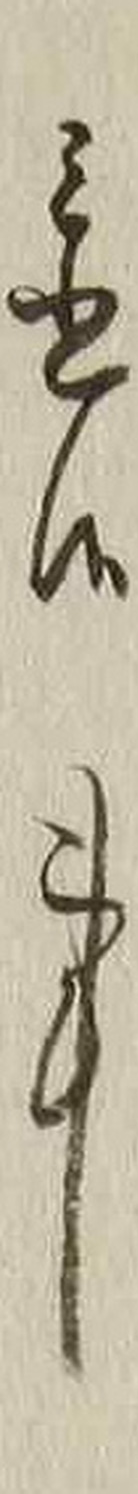置候事
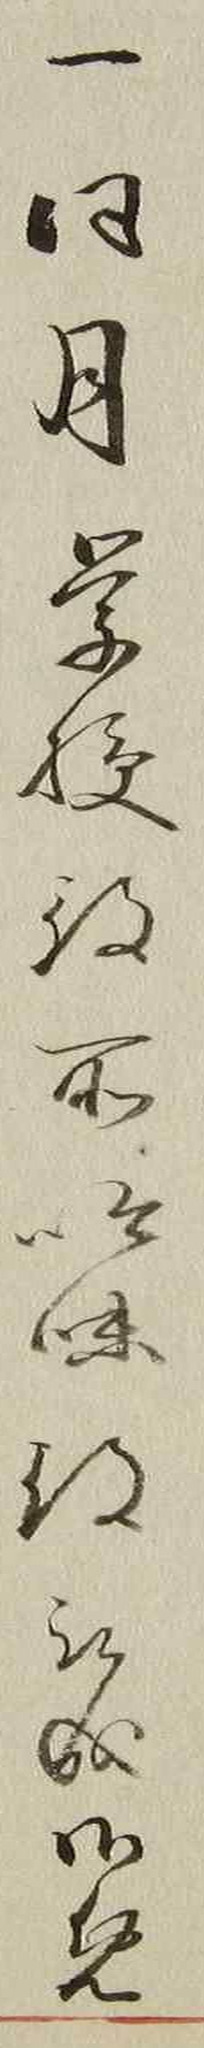一同月学校役所吟味役被成御免
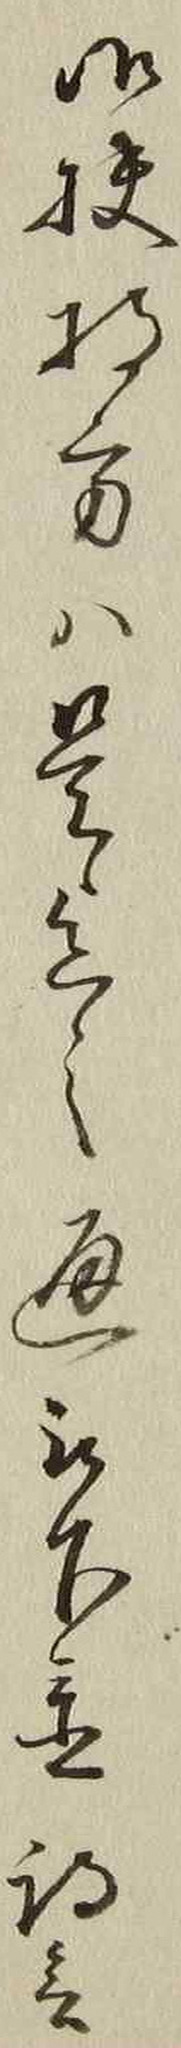御扶持方ハ是迄之通被下置詩会
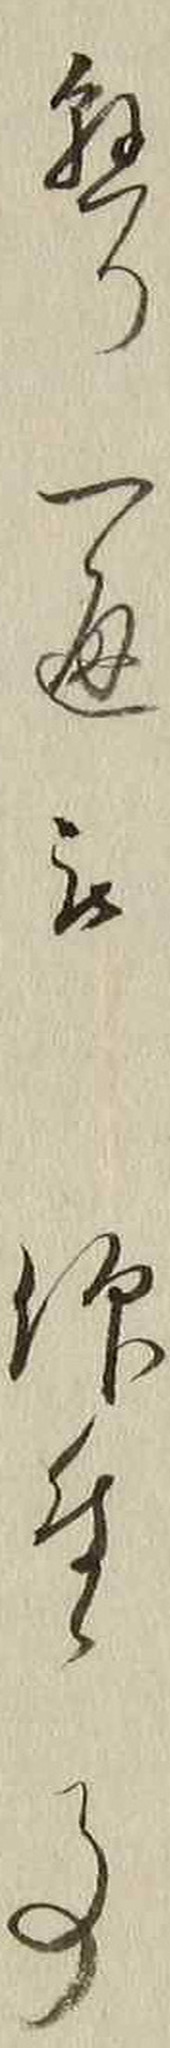懸り一通被仰付候事
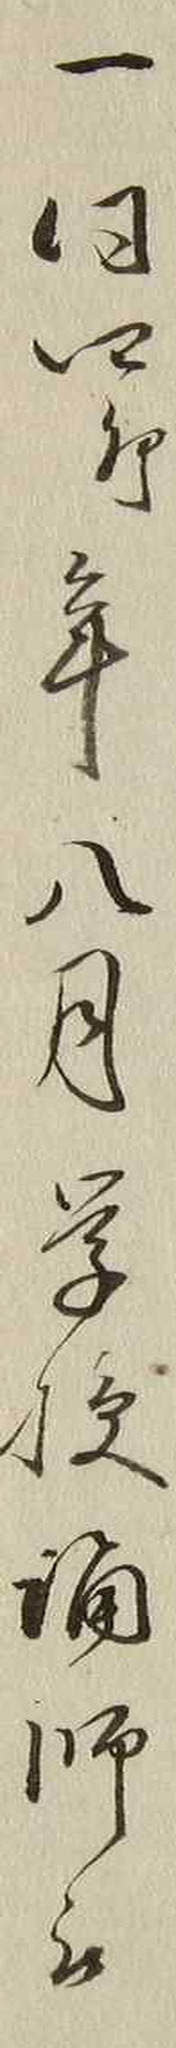一同四卯年八月学校誦師被
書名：諸士系譜　巻之28　い之部28
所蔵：会津若松市立会津図書館
